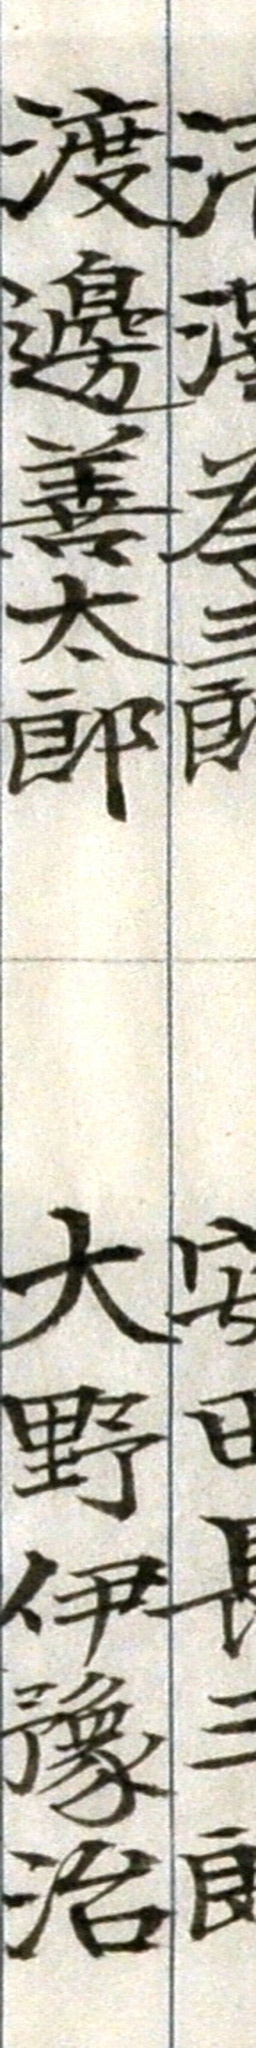渡辺善太郎大野伊予治
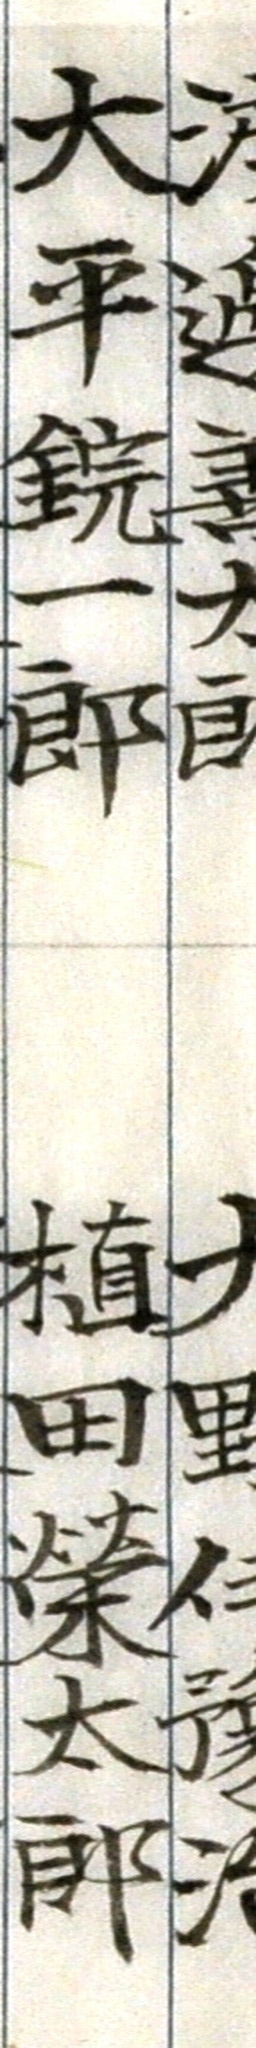大平鋎一郎植田栄太郎
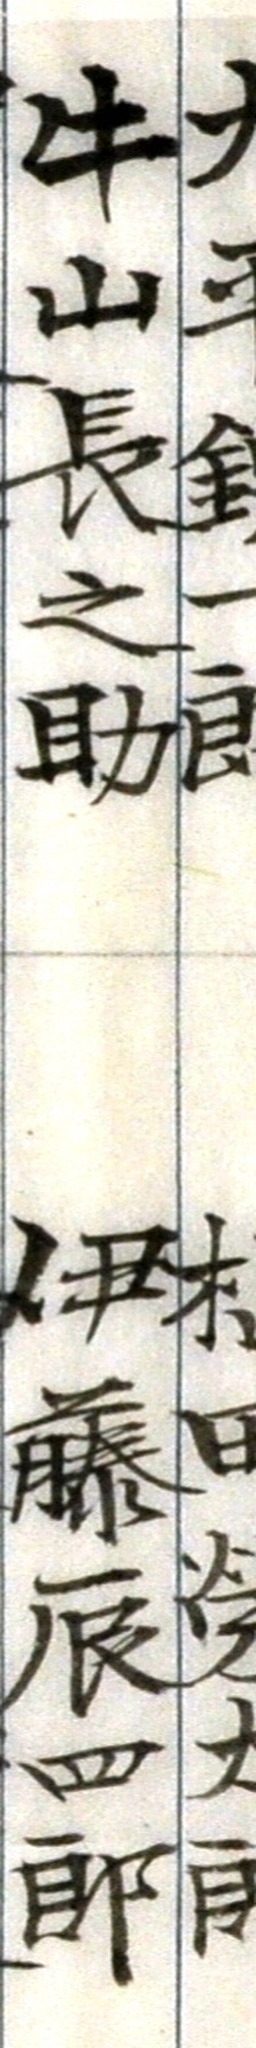牛山長之助伊藤辰四郎
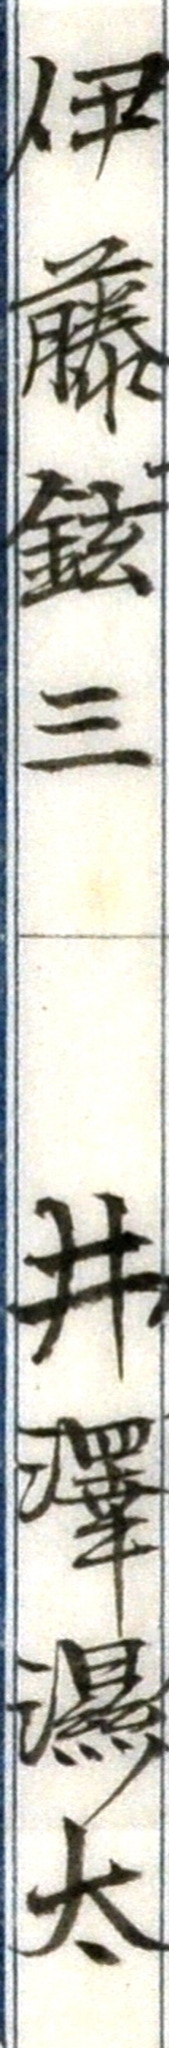伊藤鉉三井澤濕太
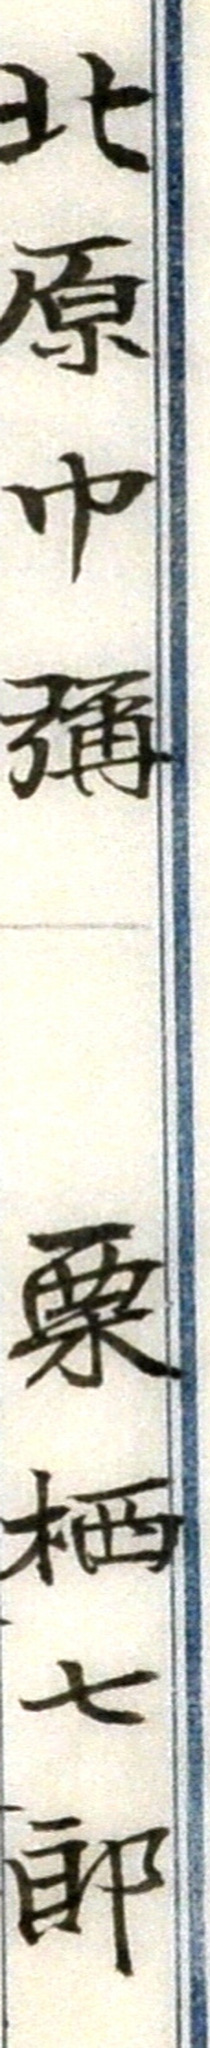北原巾弥栗栖七郎
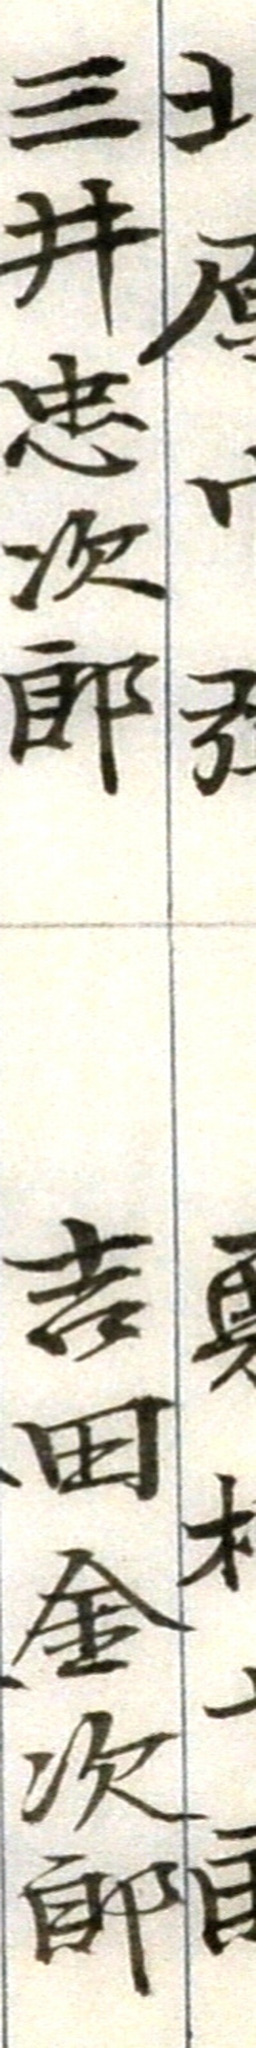三井忠次郎吉田金次郎
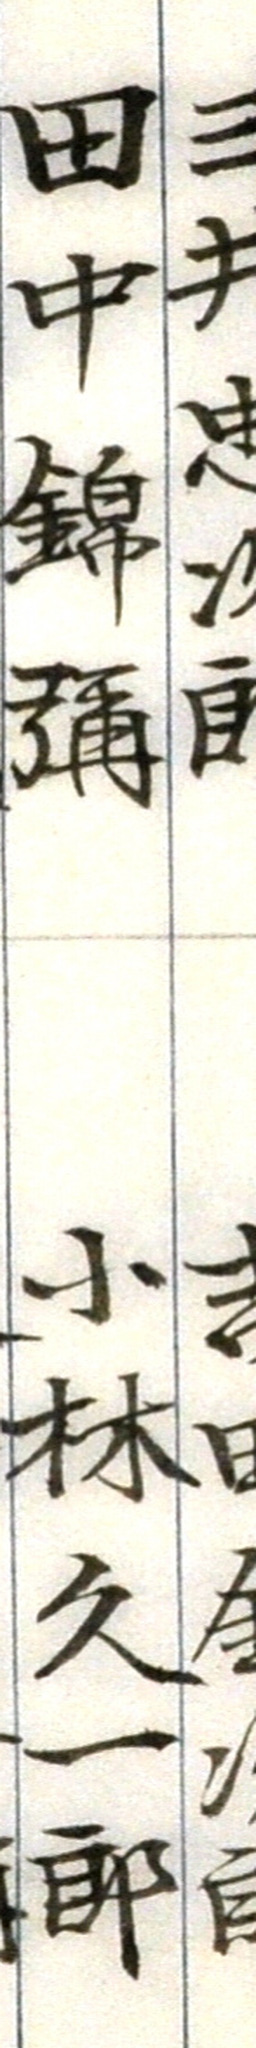田中錦弥小林久一郎
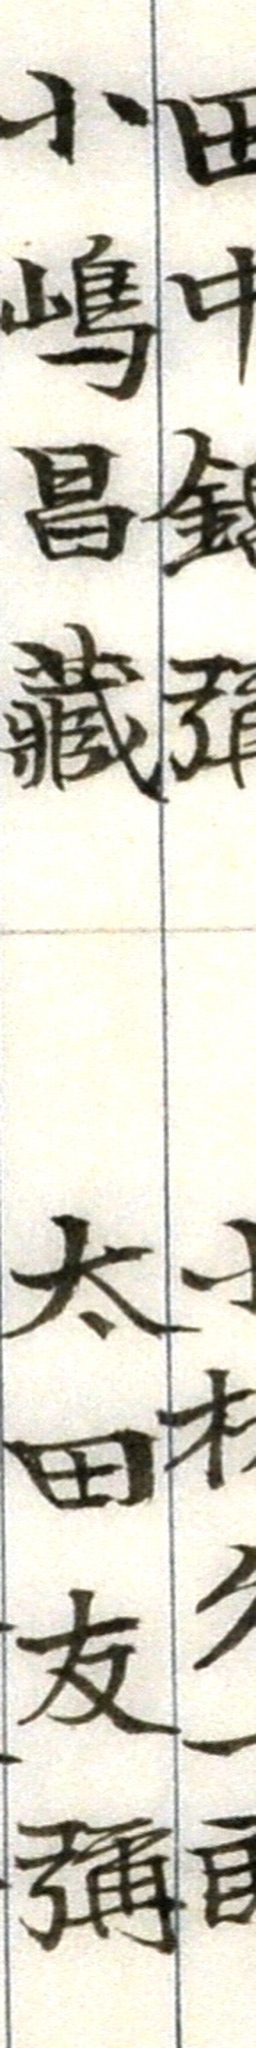小嶋昌蔵太田友弥
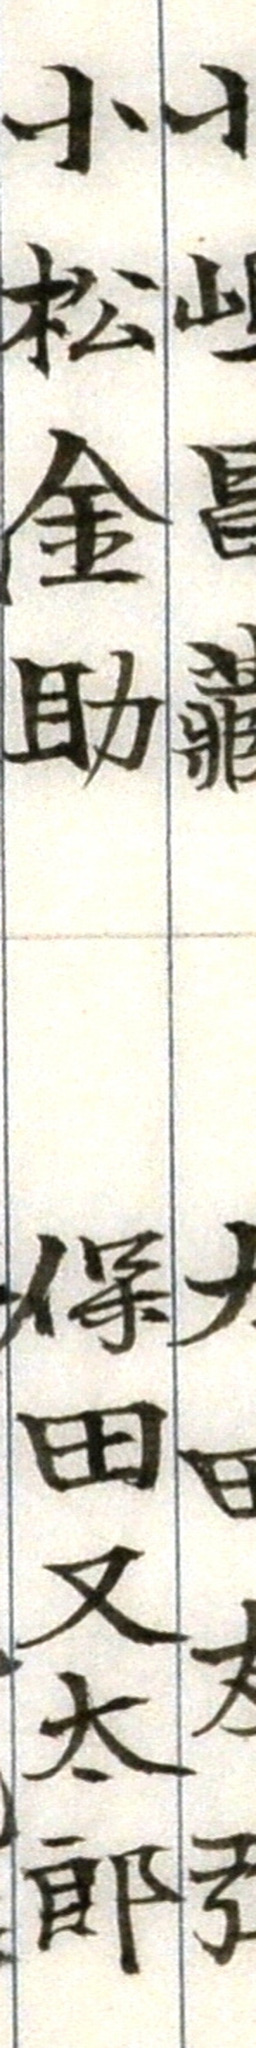小松金助保田又太郎
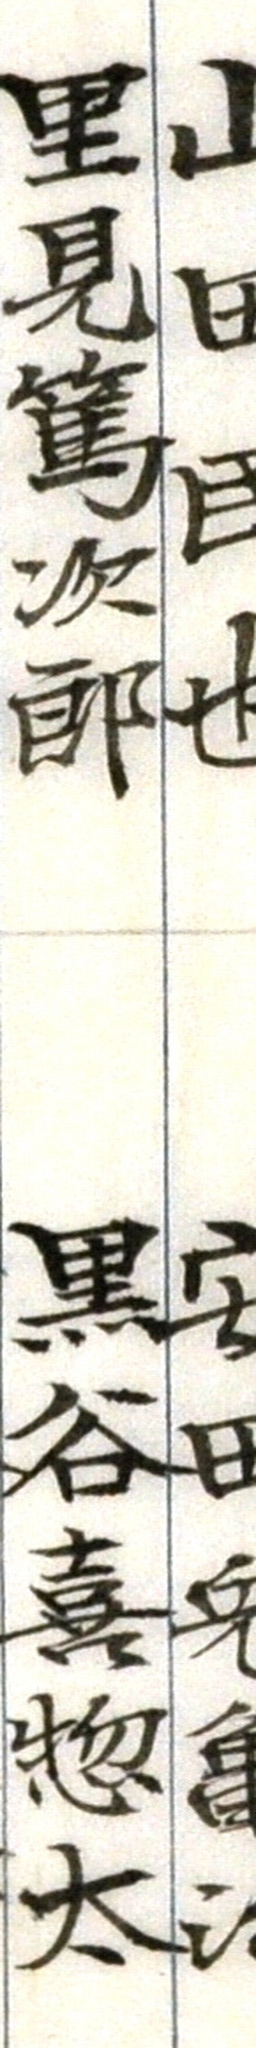里見篤次郎黒谷喜惣太
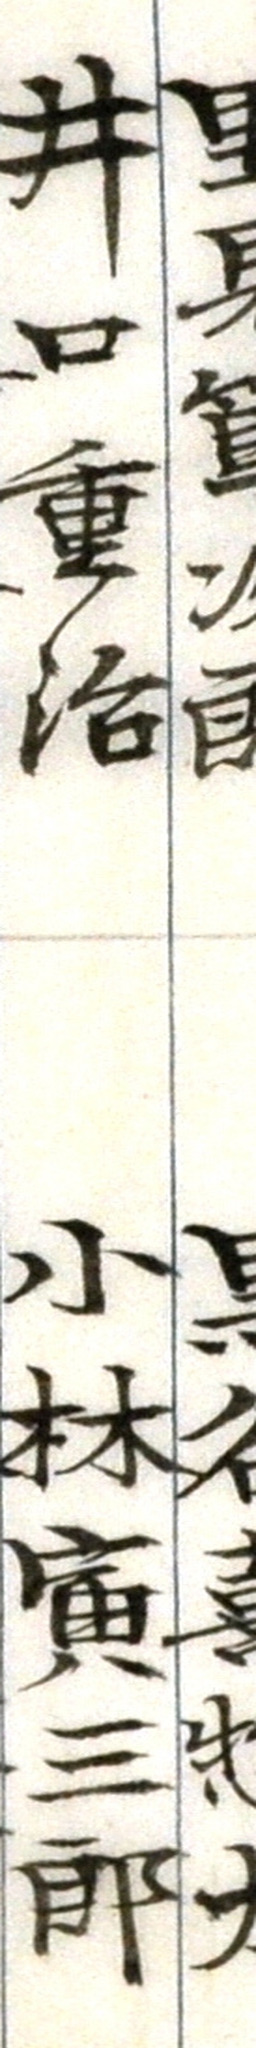井口重治小林寅三郎
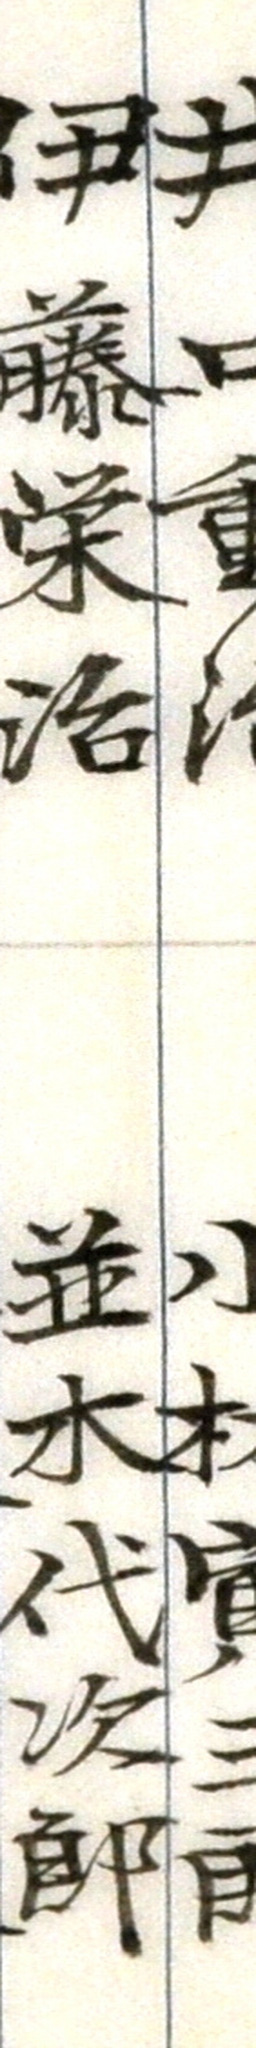伊藤栄治並木代次郎
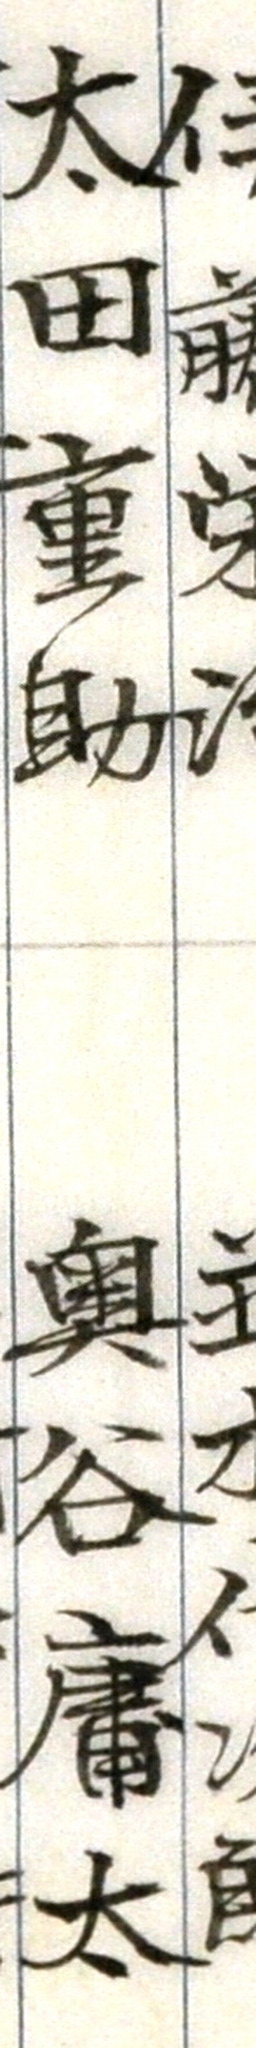太田重助奥谷庸太
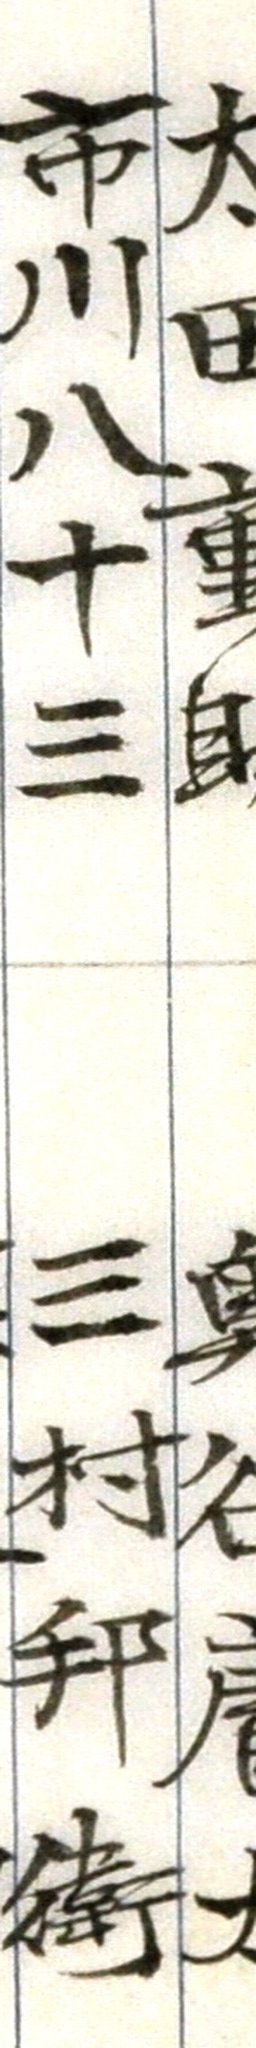市川八十三三村邦衛
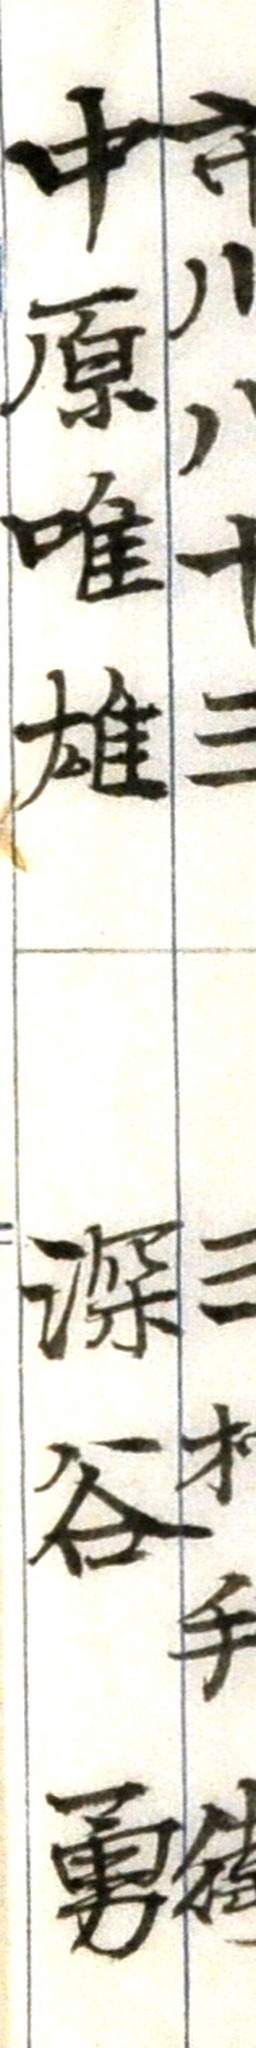中原唯雄深谷勇

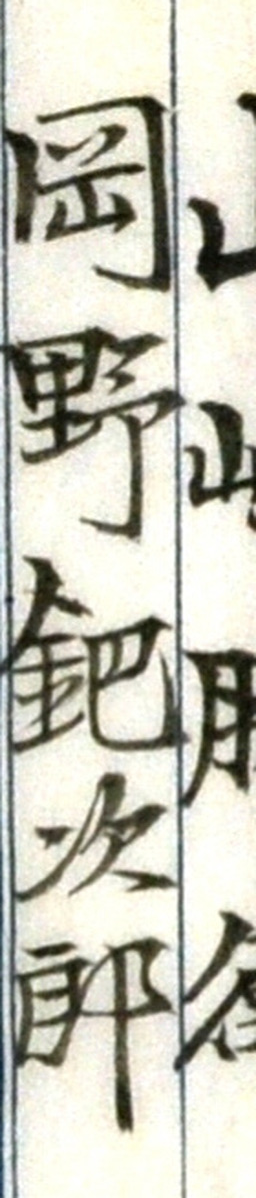岡野鈀次郎
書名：高遠藩兵員名簿歩兵銃隊・郷村募集員
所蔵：伊那市立高遠町図書館・合同会社AMANE
